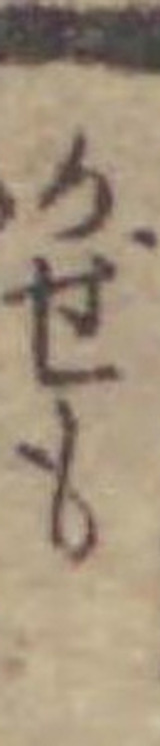かぜも
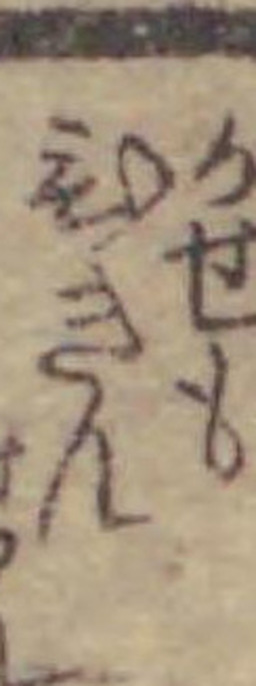ひきん
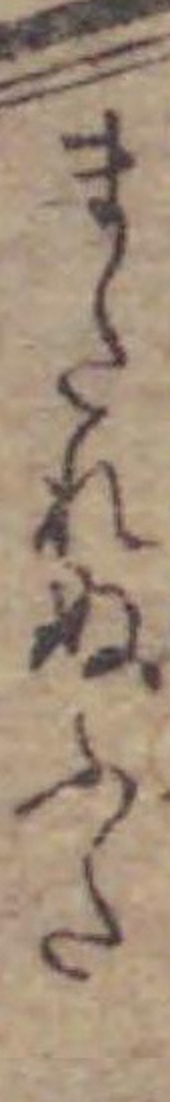またれぬふた
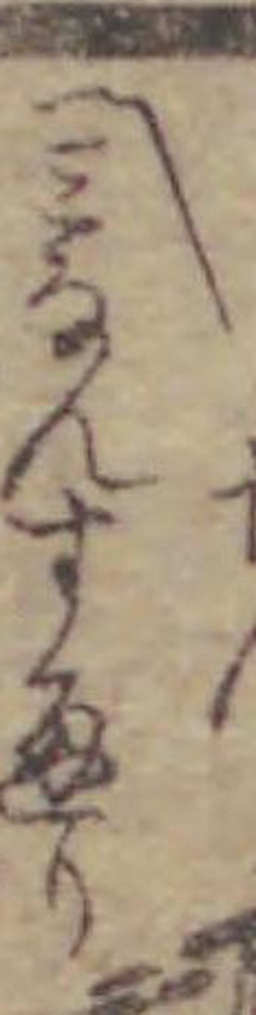「みなんす通り
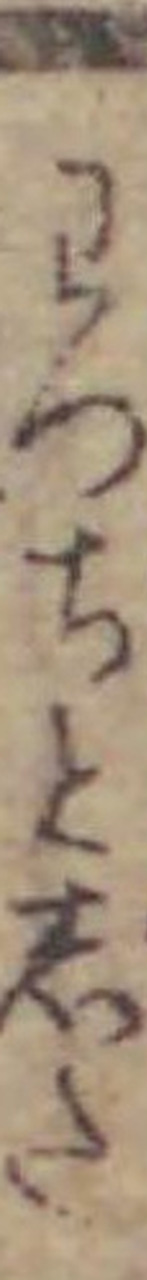わつちとした
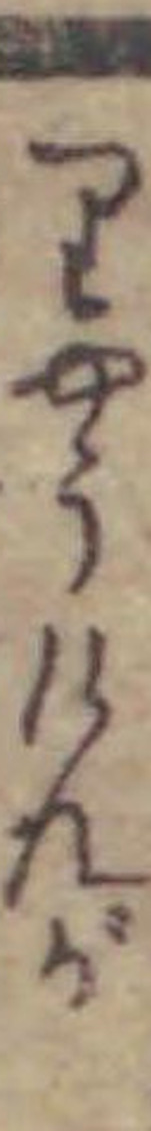りやうけんが
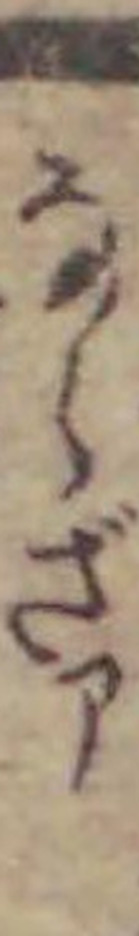ならざァ
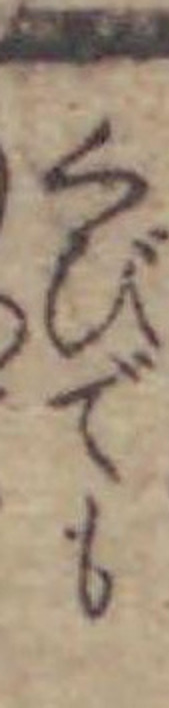くびでも

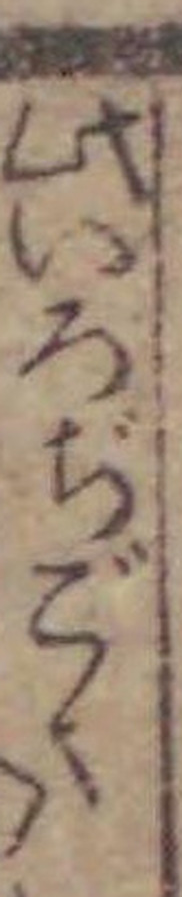此いろぢごく
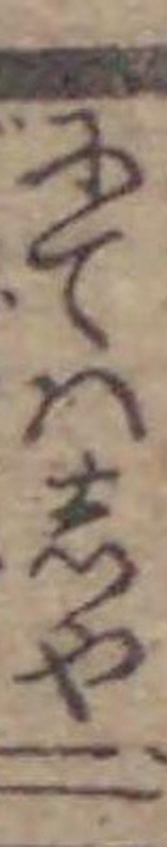にてはしや
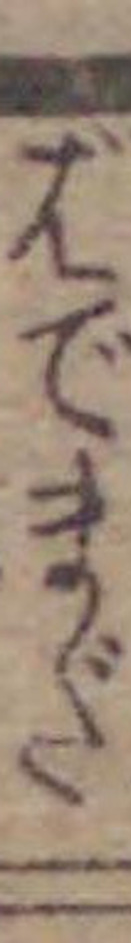ばでまだ
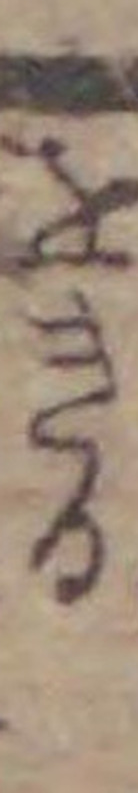をきる
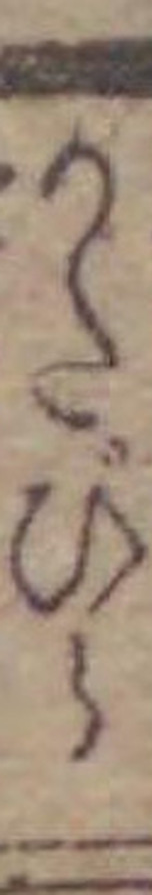かたびら
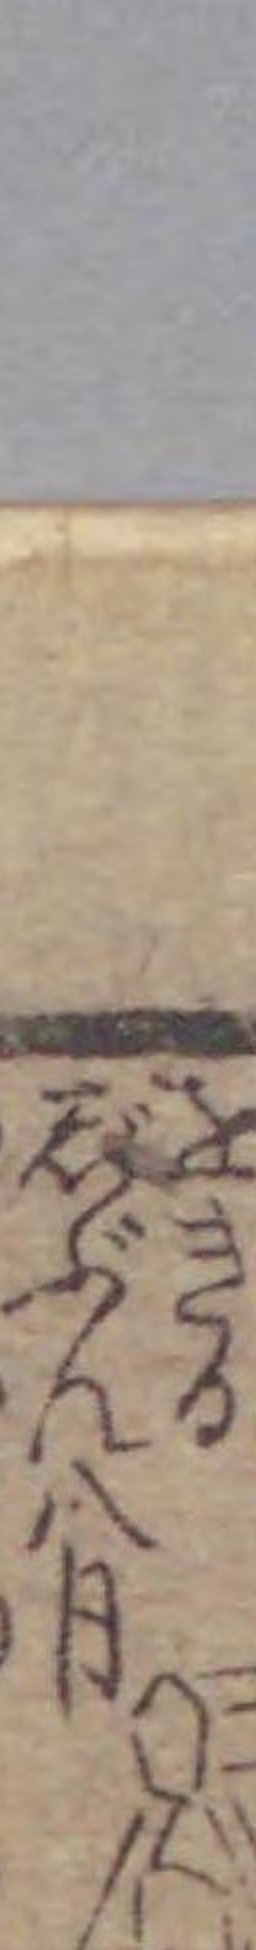じぶん八月
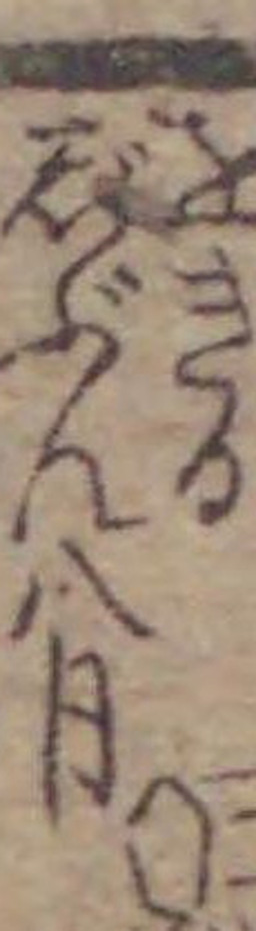じぶん八月
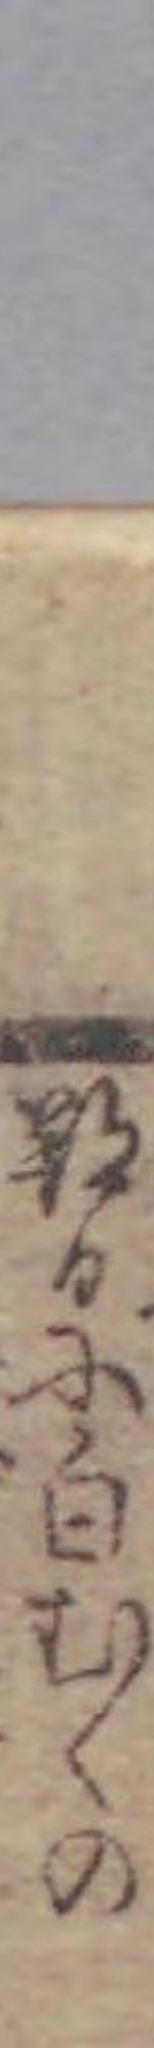数日に白むくの
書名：九替十年色地獄 : 3巻
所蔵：国立国会図書館 National Diet Library, JAPAN
